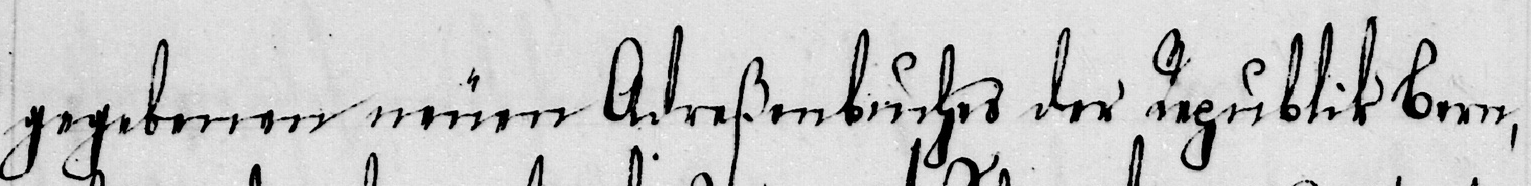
gegebenen neuen Adreßenbuches der Republik Bern,
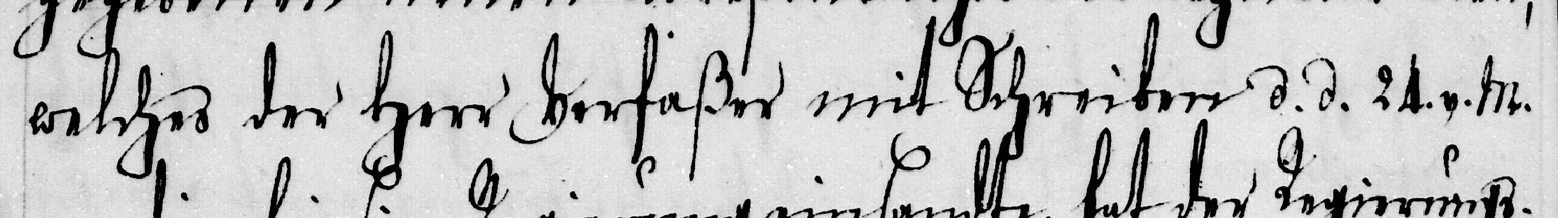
welches der Herr Verfaßer mit Schreiben d. d. 24. v.
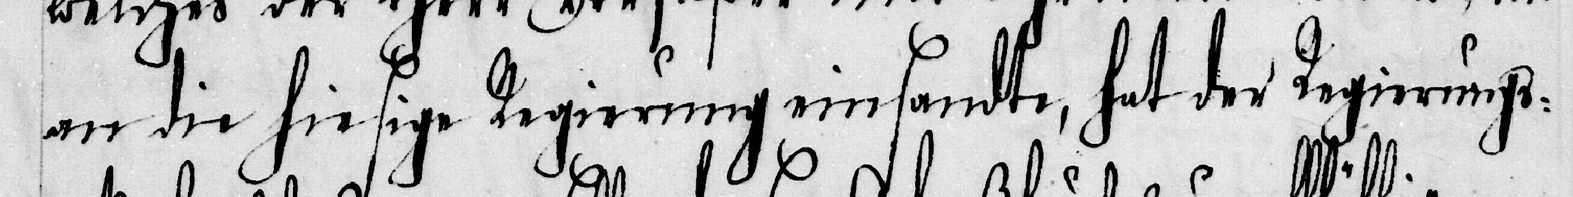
an die hiesige Regierung einsandte, hat der Regierungs¬
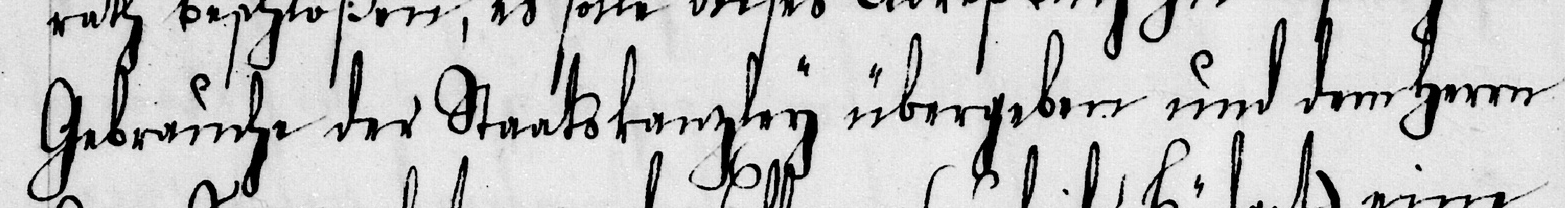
Gebrauche der Staatskanzley übergeben und dem Herrn
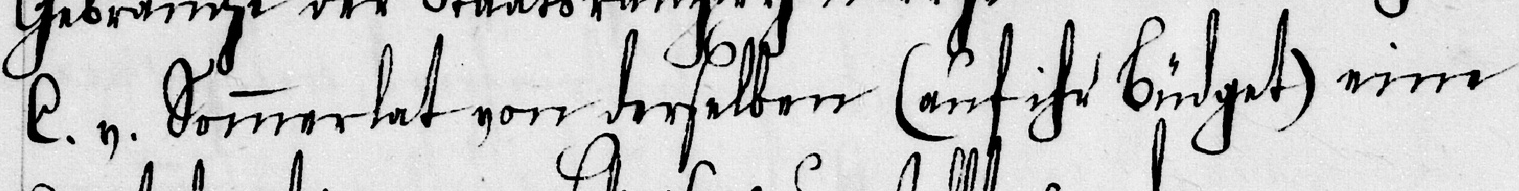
C. v. Sommerlat von derselben (auf ihr Büdget) eine
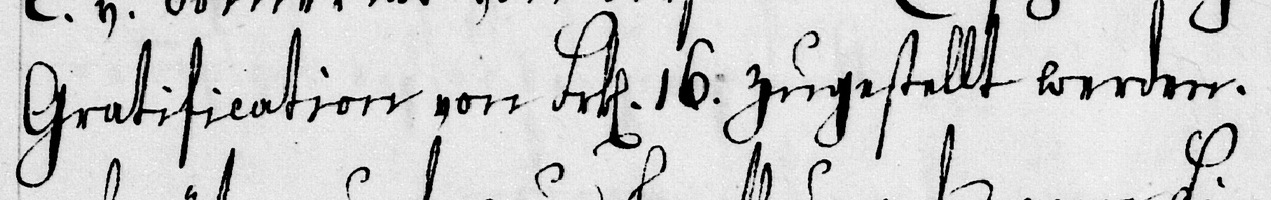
Gratification von Frk[en]. 16. zugestellt werden.
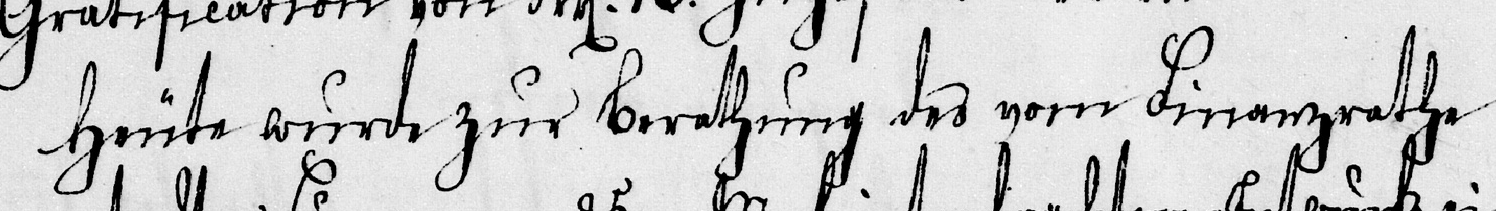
Heute wurde zur Berathung des vom Finanzrathe
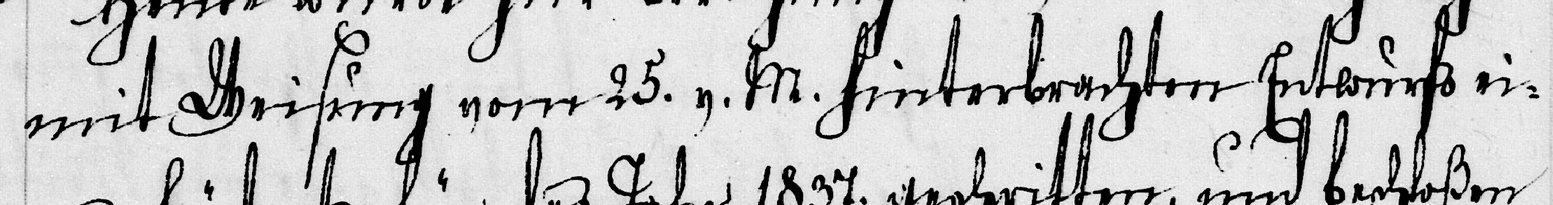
mit Weisung vom 25. d. M. hinterbrachten Entwurfs ei¬
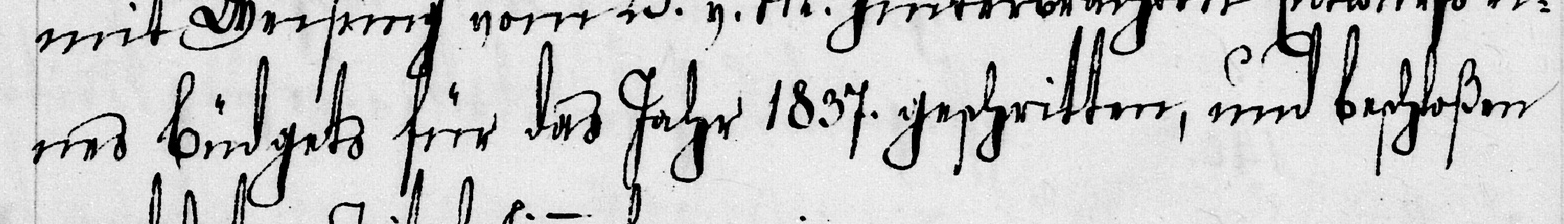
nes Büdgets für das Jahr 1837. geschritten, und beschloßen
